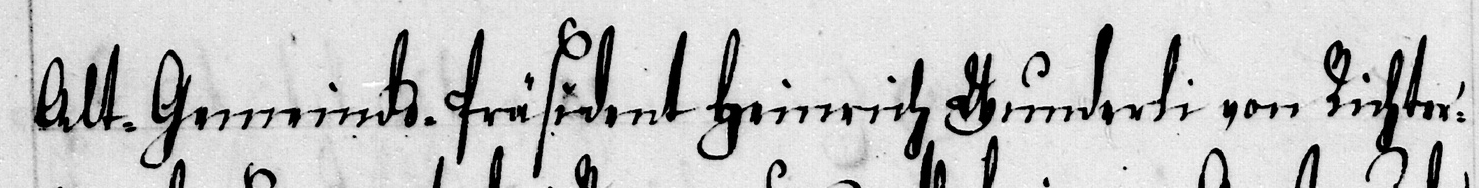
Alt-Gemeinds-Präsident Heinrich Wunderli von Richter¬
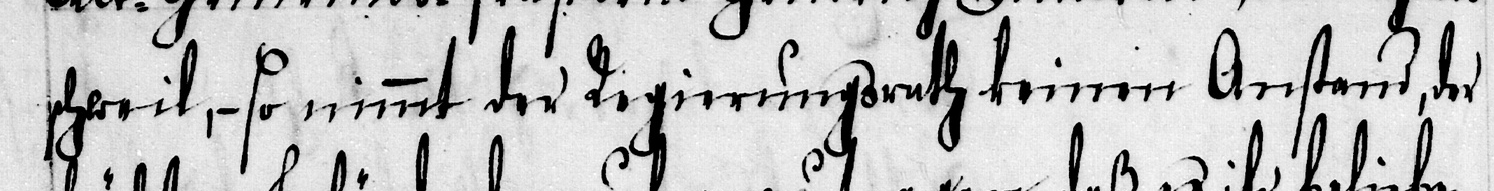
schweil, – so nimmt der Regierungsrath keinen Anstand, der
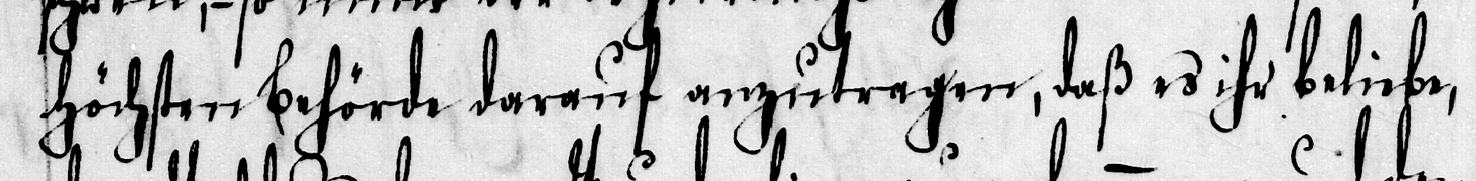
Höchsten Behörde darauf anzutragen, daß es ihr beliebe,
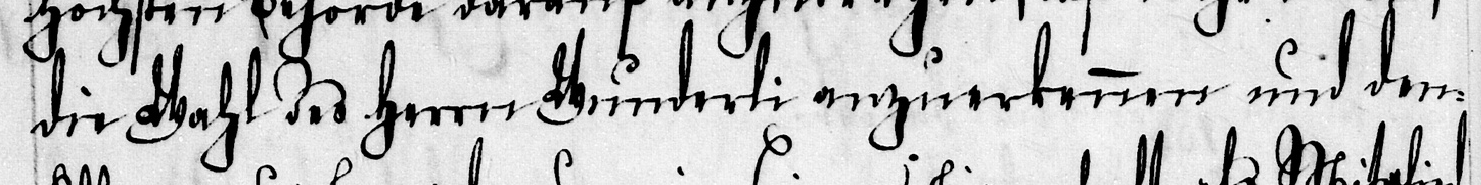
die Wahl des Herrn Wunderli anzuerkennen und den¬
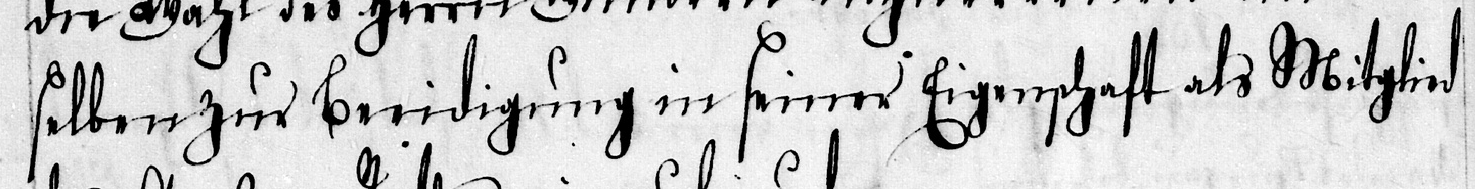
selben zur Beeidigung in seiner Eigenschaft als Mitglied
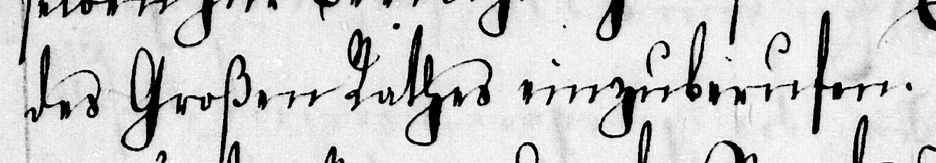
des Großen Rathes einzuberufen.
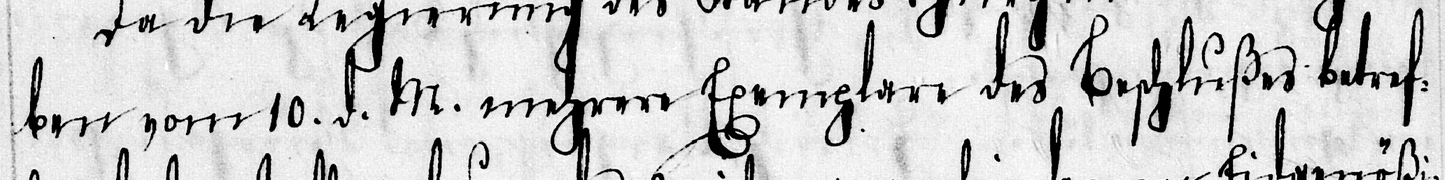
ben vom 10. d. M. mehrere Exemplare des Beschlußes betref¬
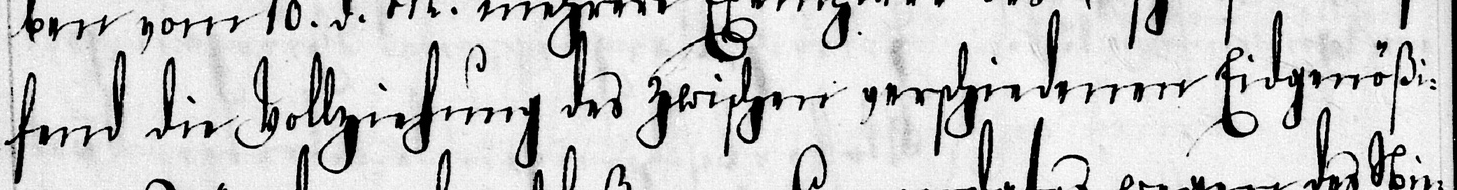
fend die Vollziehung des zwischen verschiedenen Eidgenößi¬
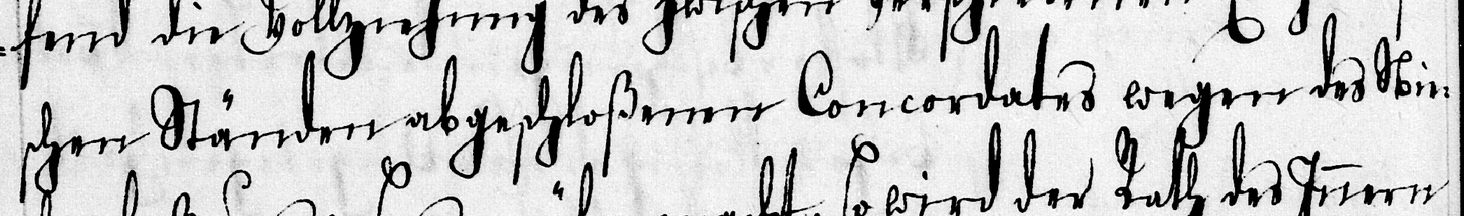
schen Ständen abgeschloßenen Concordates wegen des Nie¬
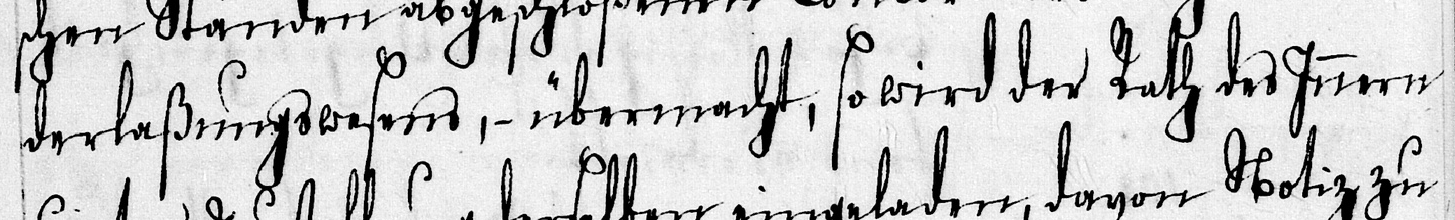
derlaßungswesens, – übermacht, so wird der Rath des Innern
